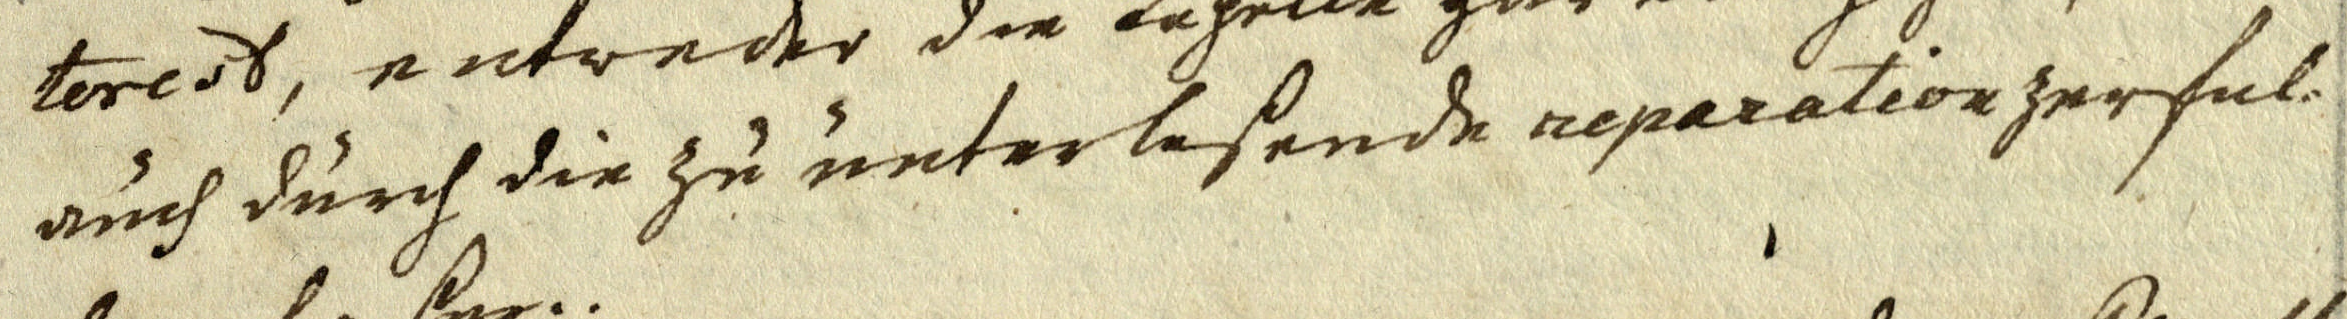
auch durch die zu unterlaßende reparation zerfal¬
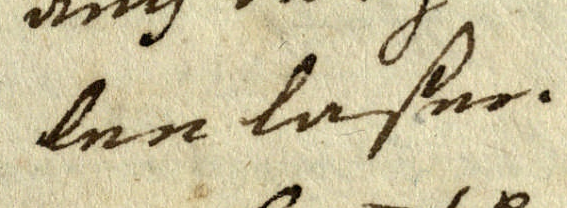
len laßen.
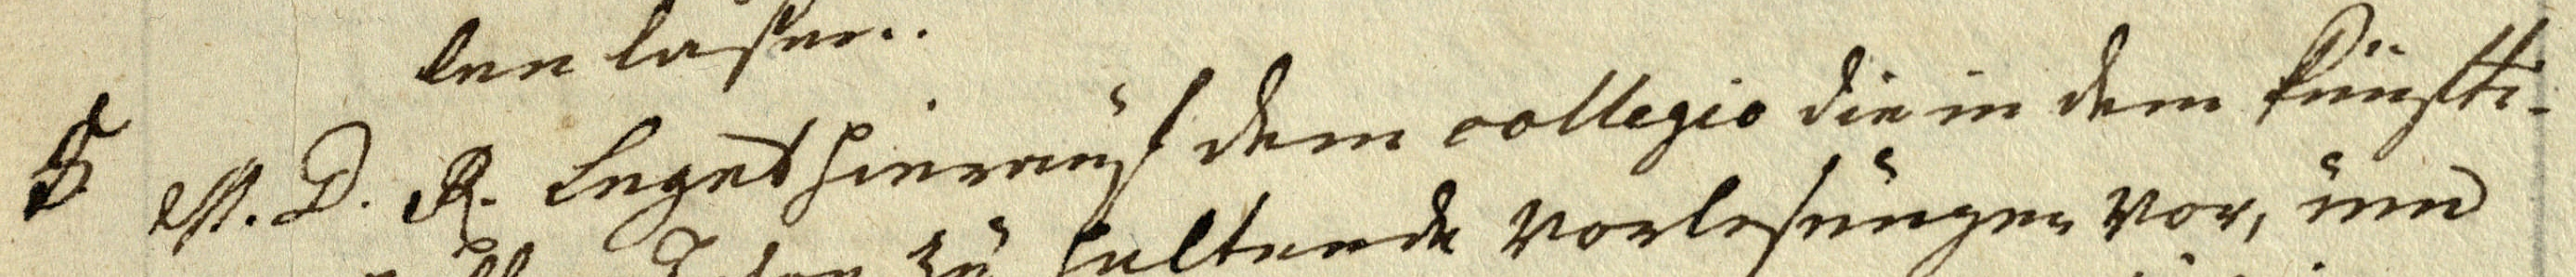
8. M. D. R. Leget hierauf dem collegio die in dem künfti¬
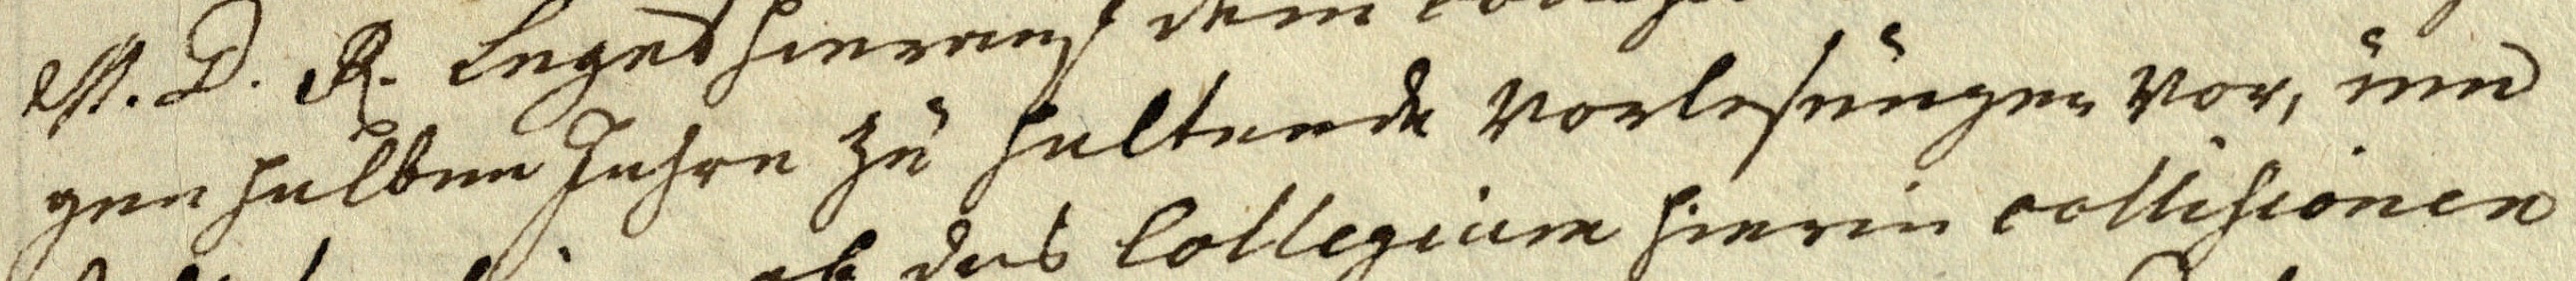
gen halben Jahre zu haltende Vorlesungen vor, und
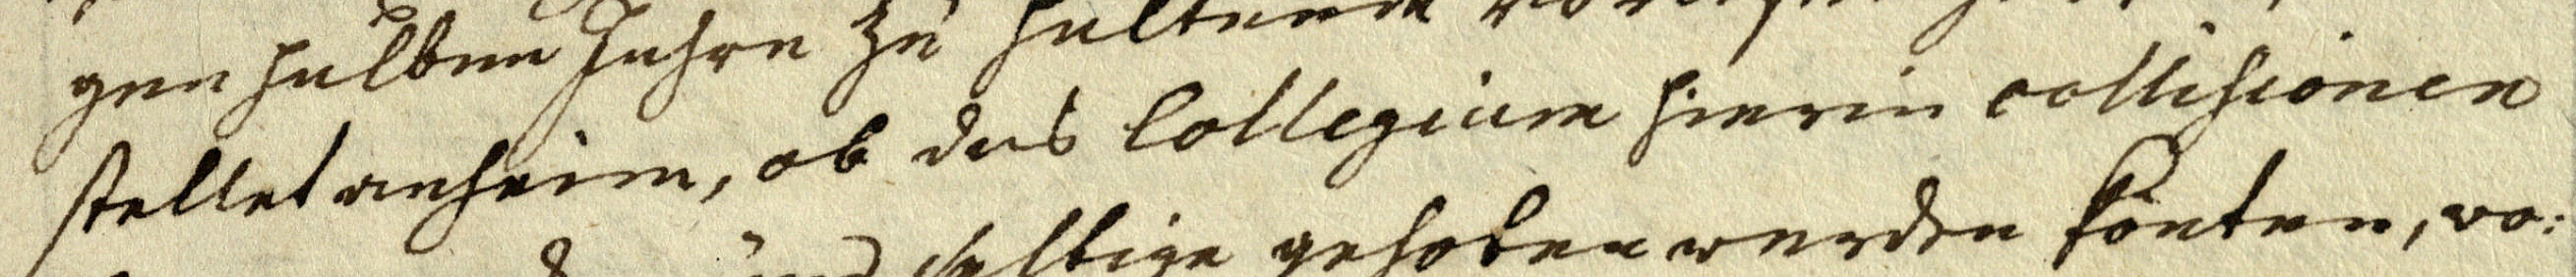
stellet anheim, ob das Collegium hierin collisionen
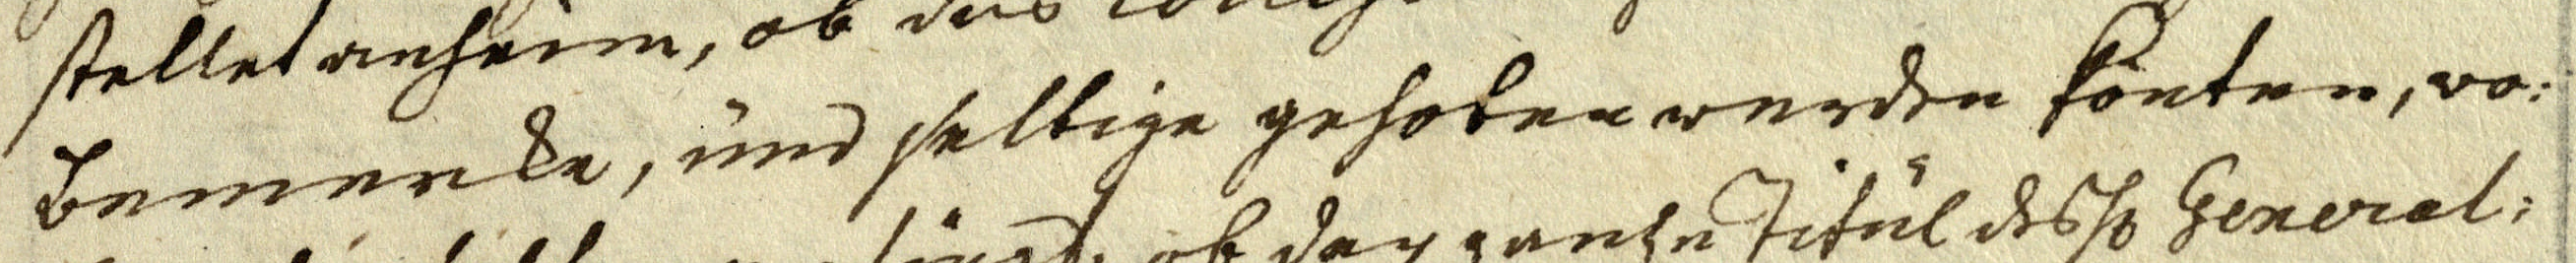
bemercke, und selbige gehoben werden könten, wo¬
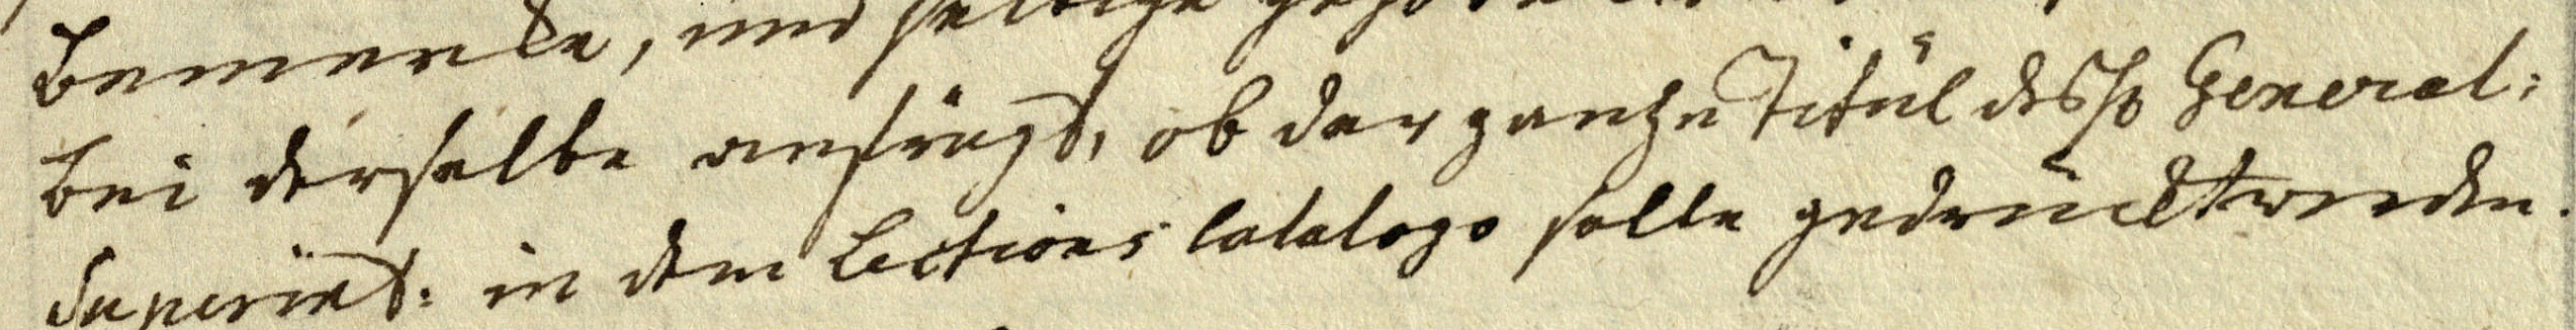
bei derselbe anfrägt, ob der ganze Titul desh. General¬
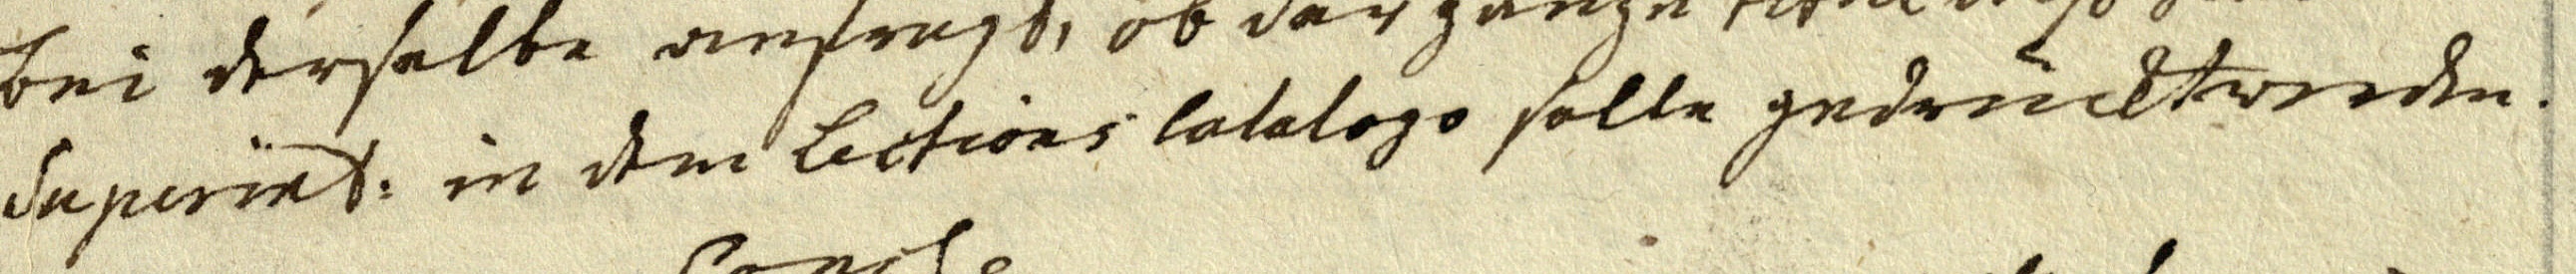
Superint. in dem Lections catalogo solle gedruckt werden.
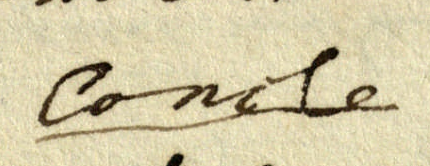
Concl.
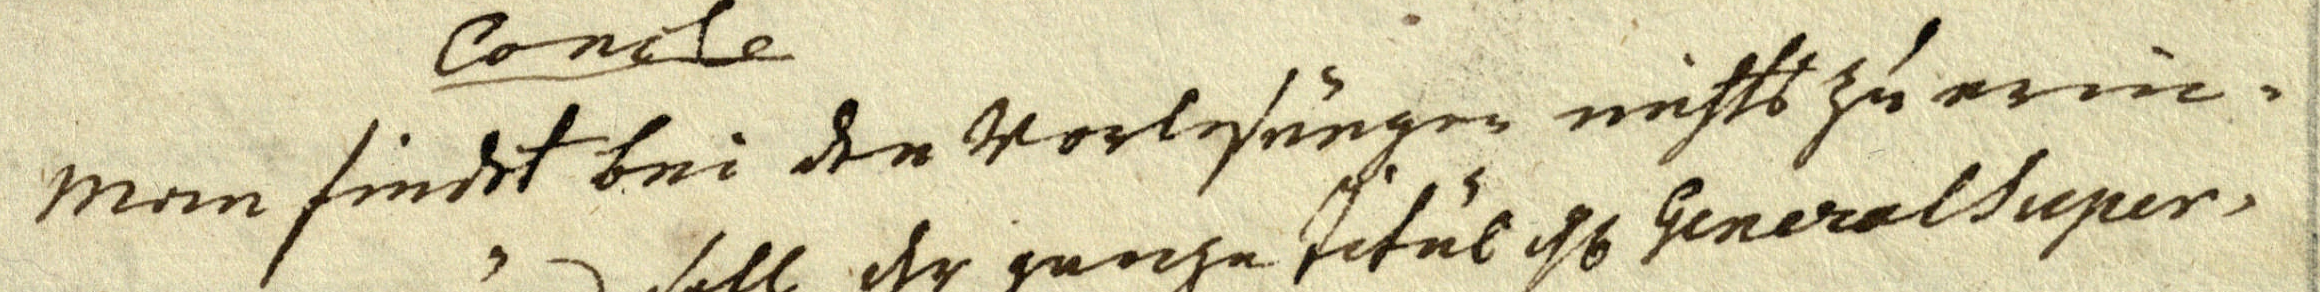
Man findet bei den Vorlesungen nichts zu erin¬
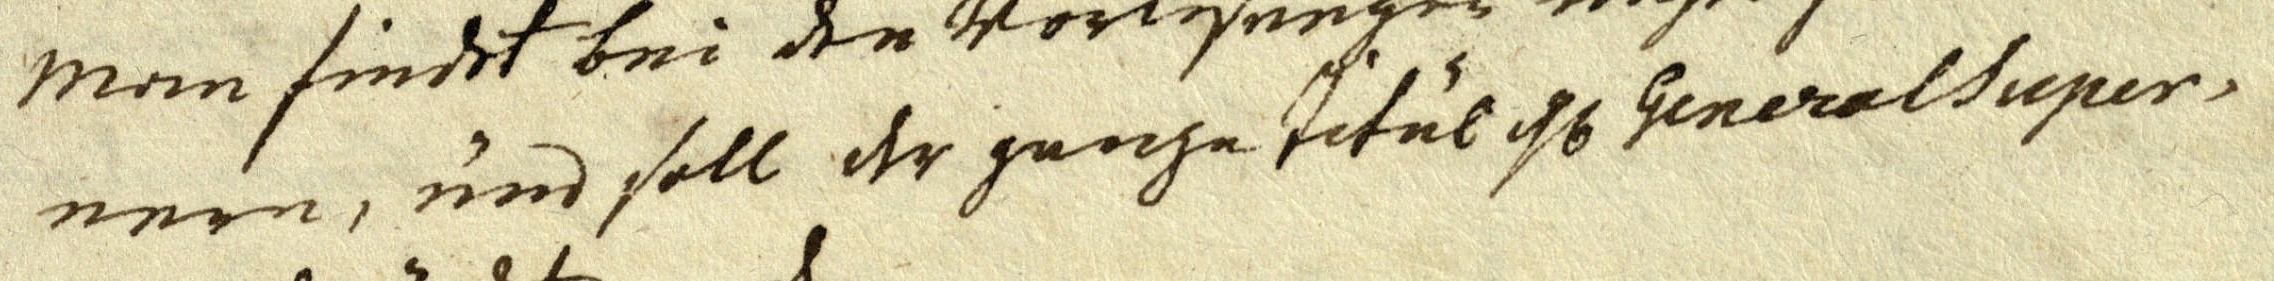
nern, und soll der ganze Titul dh. GeneralSuper.
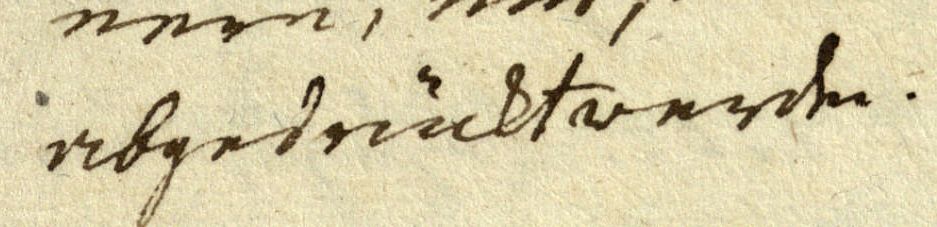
abgedruckt werden.
